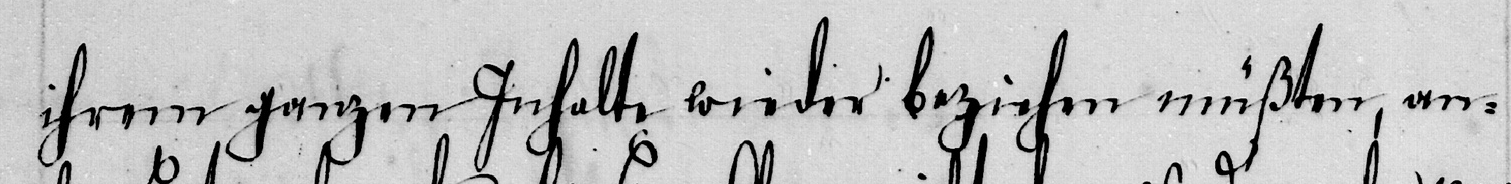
ihrem ganzen Inhalte wieder beziehen müßten, an¬
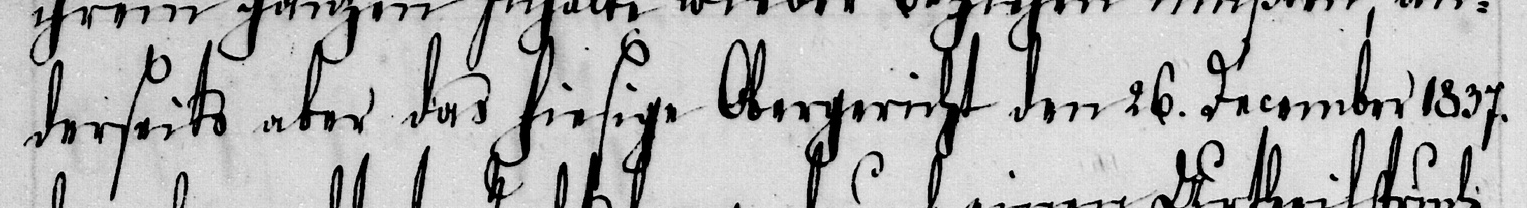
derseits aber das hiesige Obergericht den 26. December 1837.
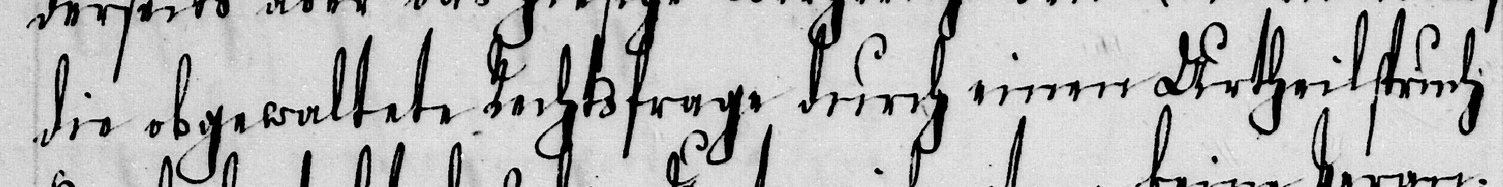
die obgewaltete Rechtsfrage durch einen Urtheilssp¬
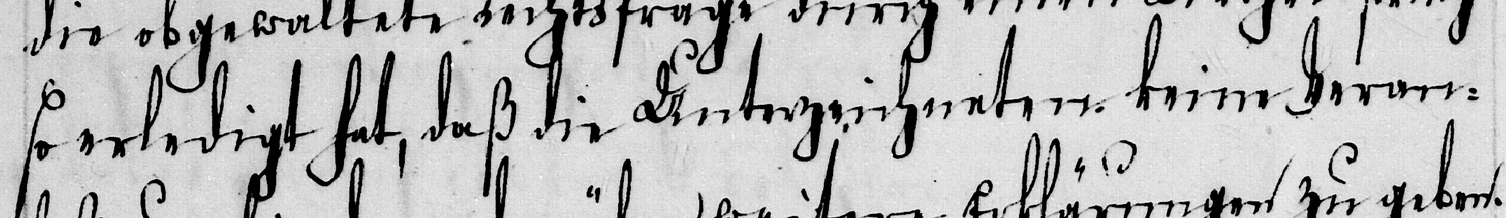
so erledigt hat, daß die Unterzeichneten keine Veran¬
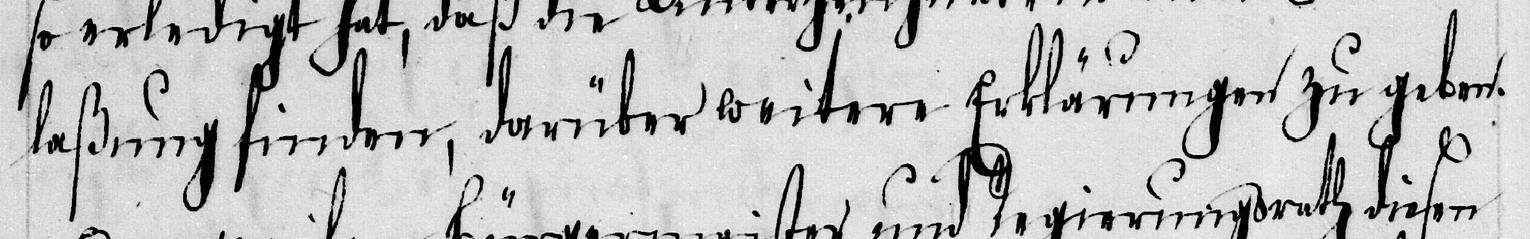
laßung finden, darüber weitere Erklärungen zu geben.
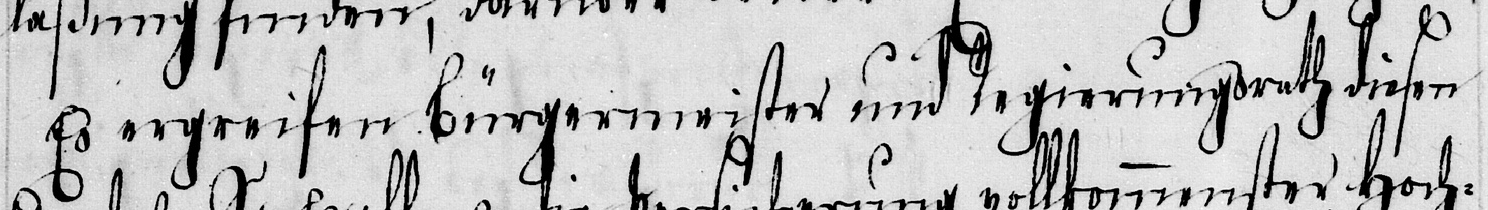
Es ergreifen Bürgermeister und Regierungsrath diesen
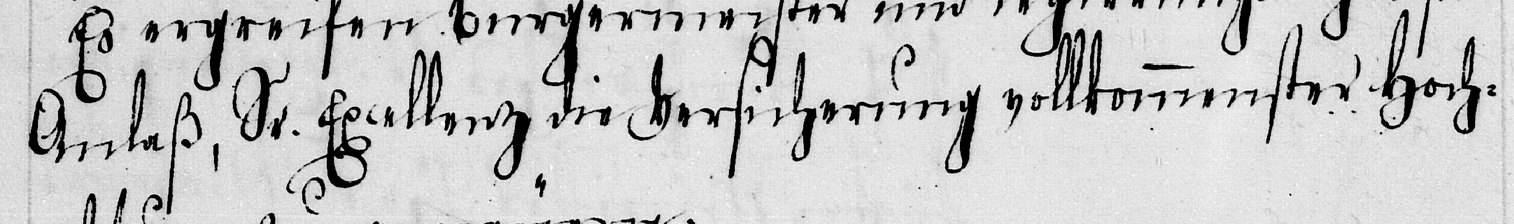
Anlaß, Se. Excellenz die Versicherung vollkommenster Hoch¬
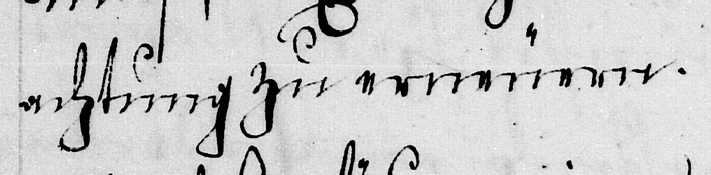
achtung zu erneuern.
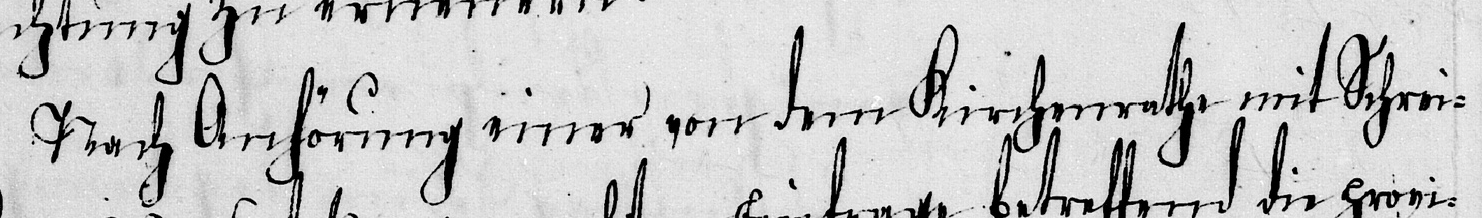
Nach Anhörung einer von dem Kirchenrathe mit Schrei¬
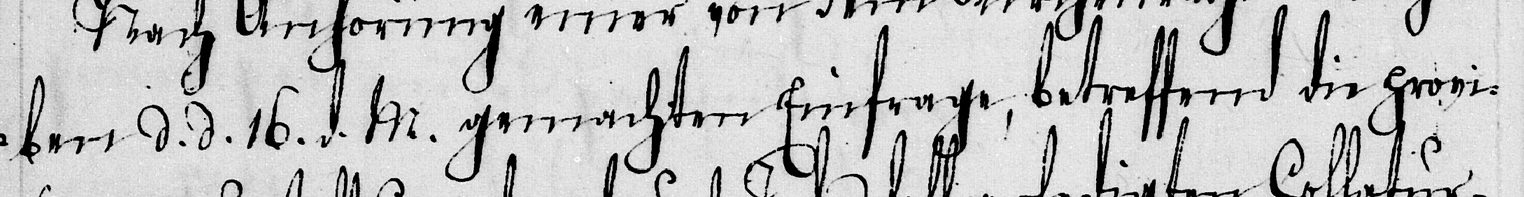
ben d. d. 16. d. M. gemachten Einfrage, betreffend die provi¬
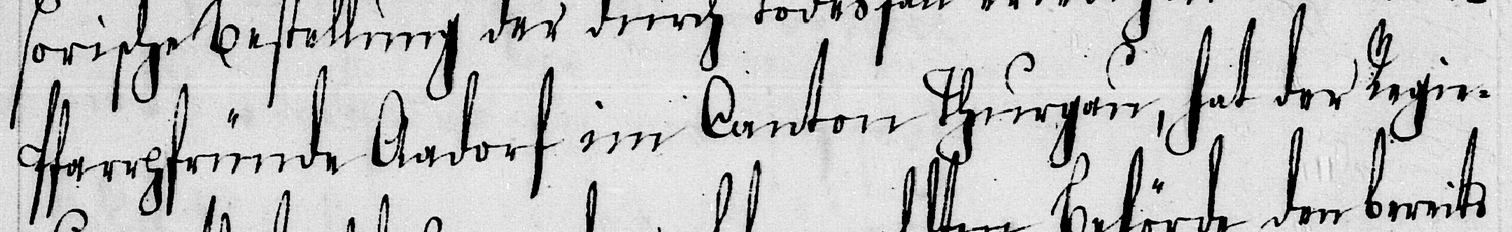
farrpfründe Aadorf im Canton Thurgau, hat der Regi¬
